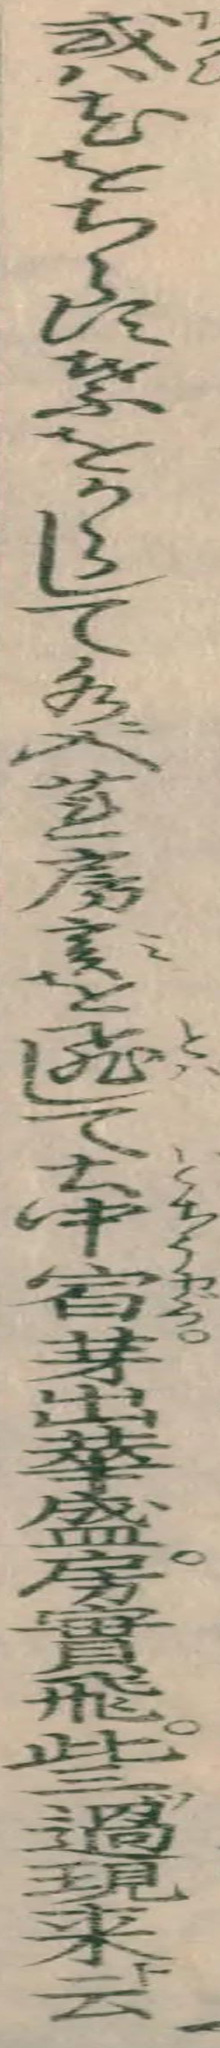或は花をちらす葉をからして水入蓮房実を飛して土中宿。芽出華盛。房実飛。此三過現来云
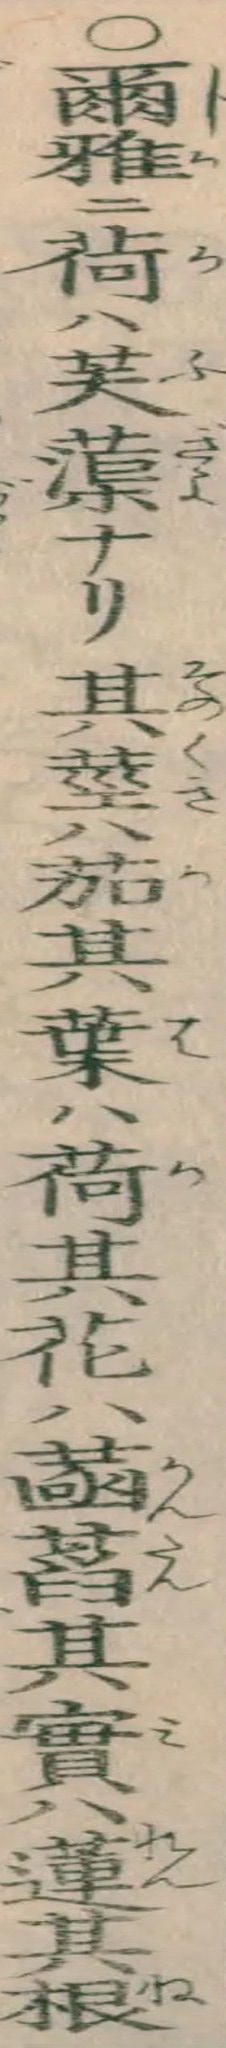○爾雅ニ荷ハ芙蕖ナリ其茎ハ茄其葉ハ荷其花ハ菡萏其実ハ蓮其根
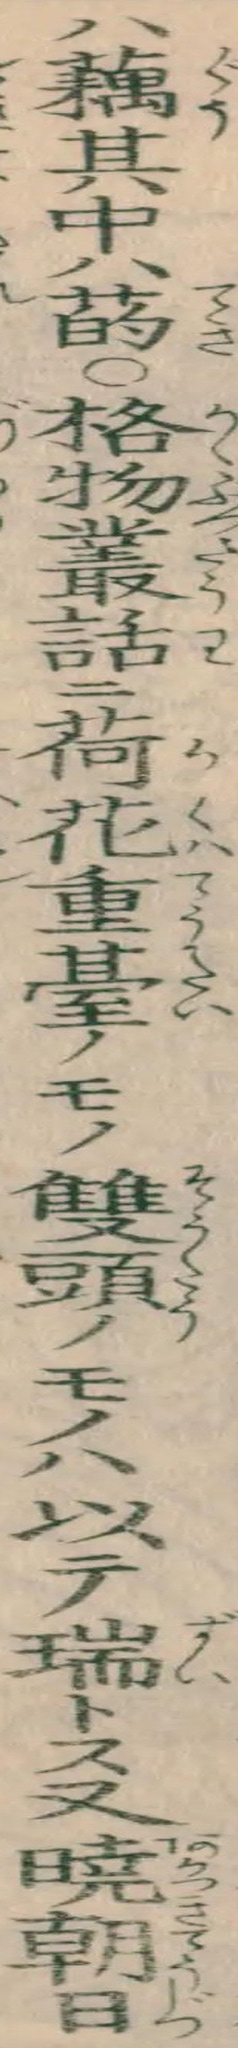ハ藕其中ハ菂○格物叢話ニ荷花重台ノモノ双頭ノモノハ以テ瑞トス又暁朝日
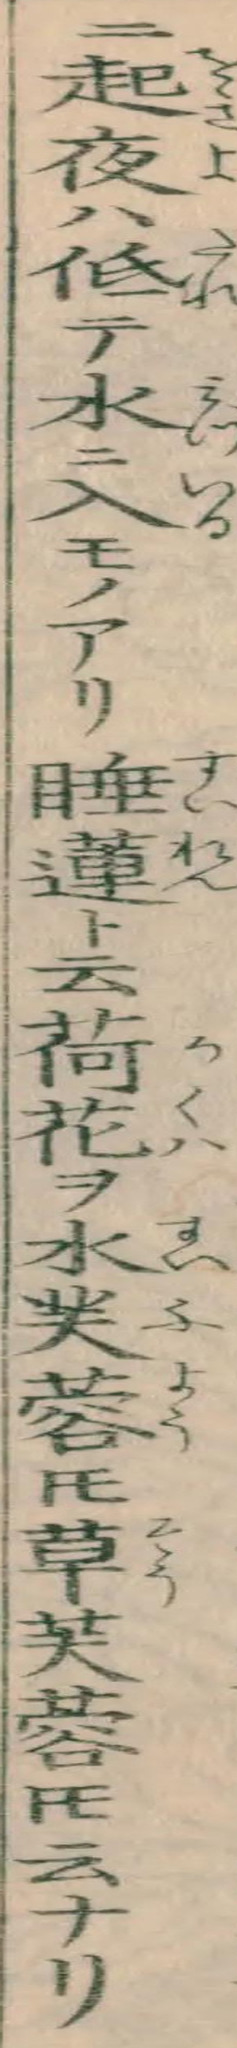ニ起夜ハ低テ水ニ入モノアリ睡蓮ト云荷花ヲ水芙蓉トモ草芙蓉トモ云ナリ
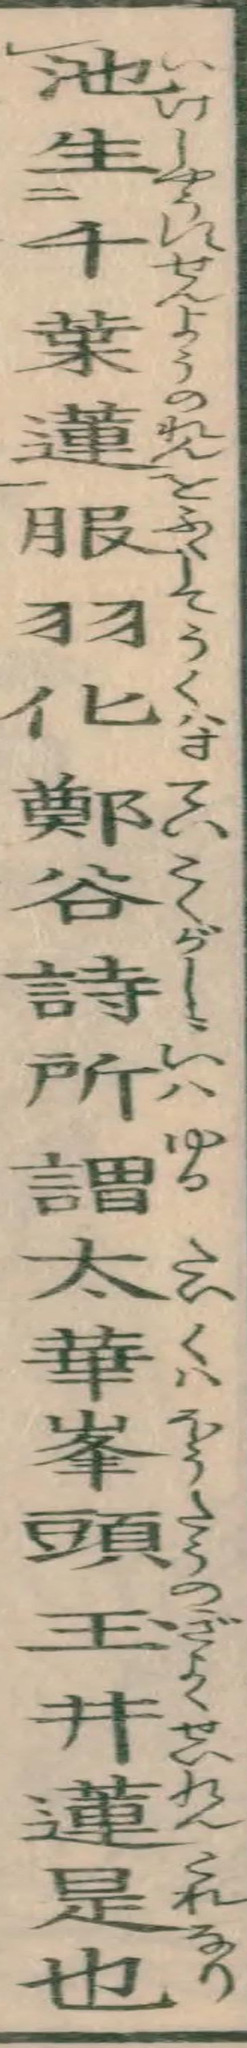池生千葉蓮服羽化鄭谷詩所謂太華峯頭玉井蓮是也
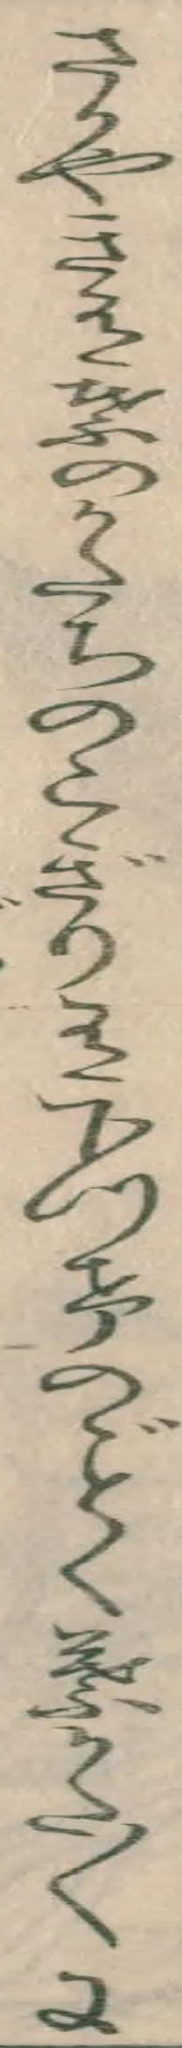さかやき有葉のかたちのこぎり有下つけのごとく葉かた〳〵に
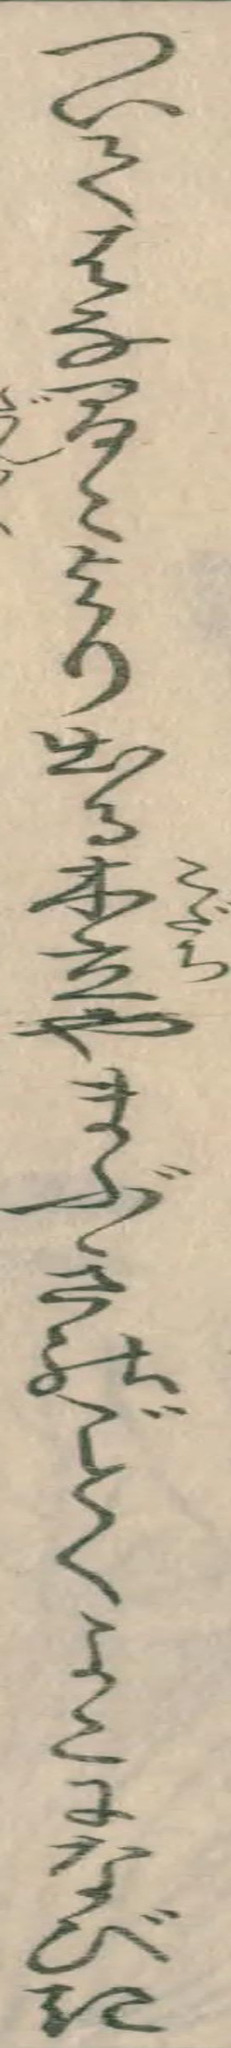ついてはな間々より出る木立やまぶきのごとくよこになびき
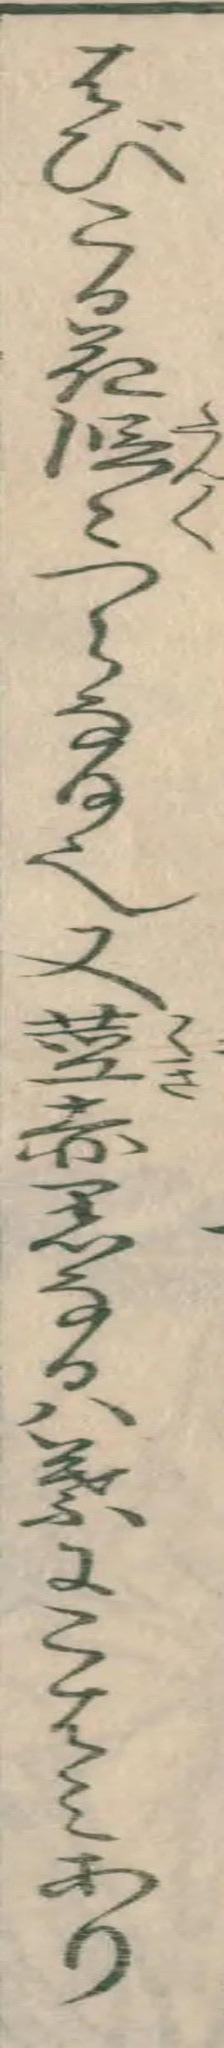はびこる花段々つらなる也又茎赤黒なるは葉にこはみあり
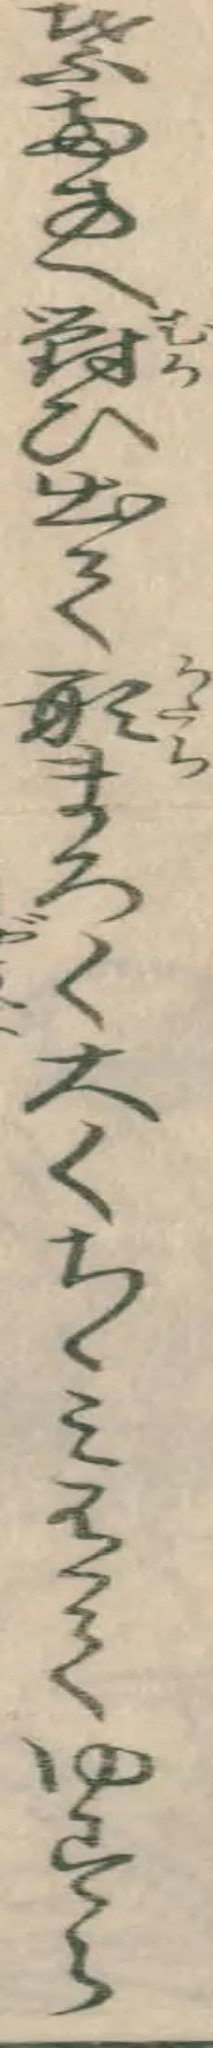葉両方へ対ひ出て形まろく大くちゝみ有てゆすら
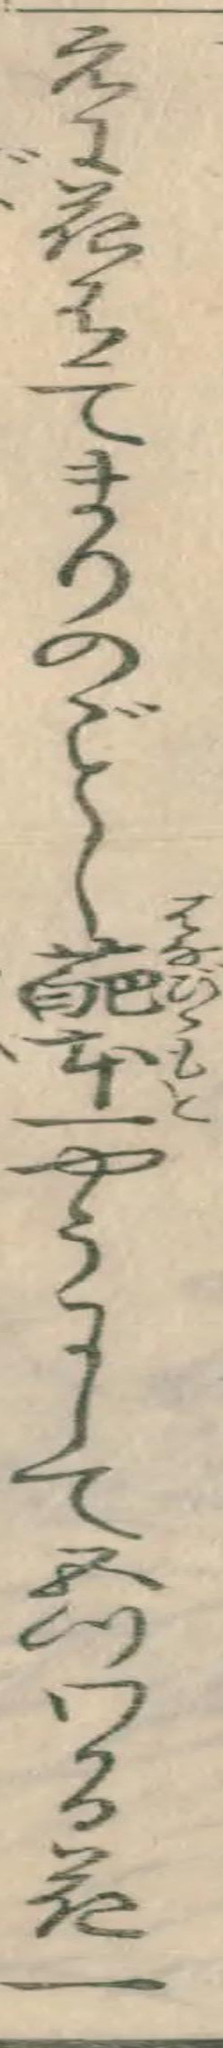えに花有てまりのごとし葩本一やうにして五つわかる花一
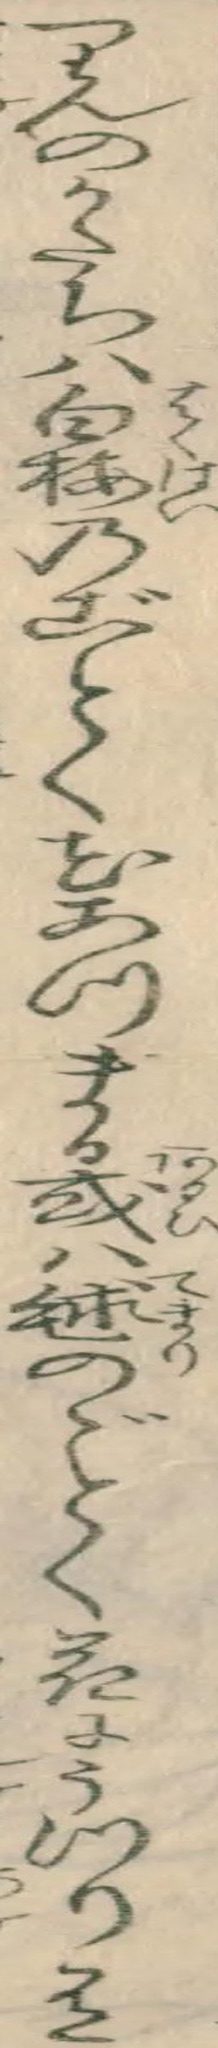りんのかたちは白梅のごとく花あつまる或は毬のごとく花にうつり有
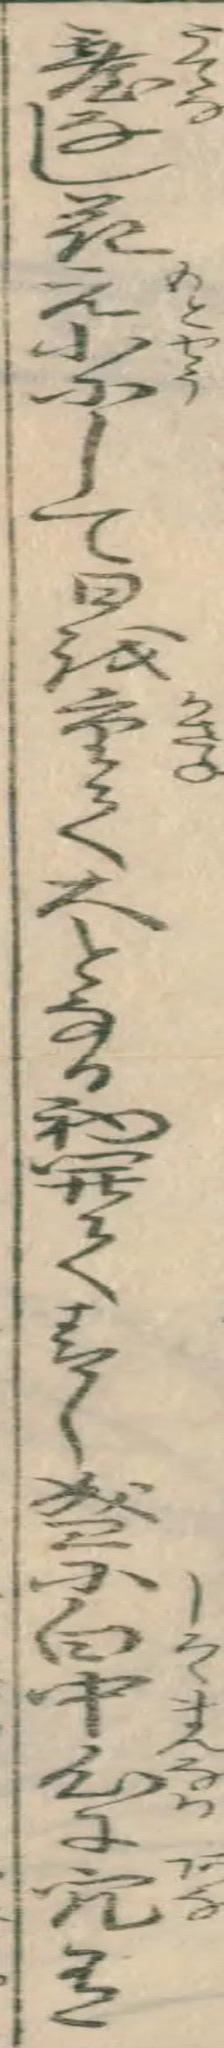台なし花元小にして日を重て大となる初開て青し盛に白中心に穴有

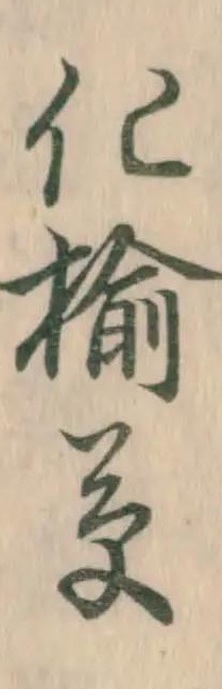化楡草
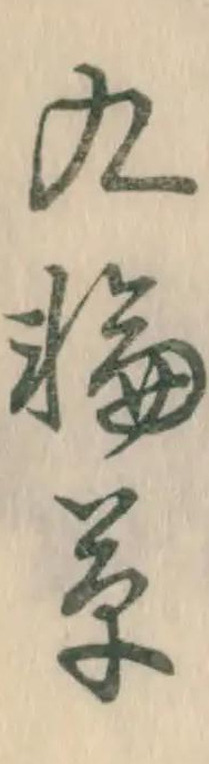九輪草

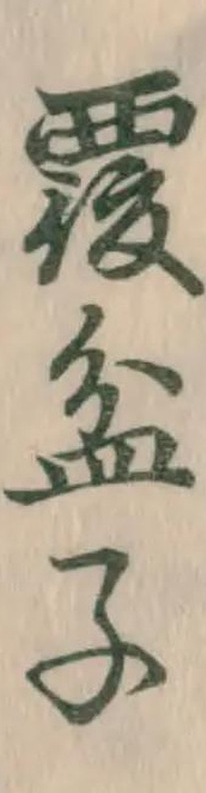覆盆子

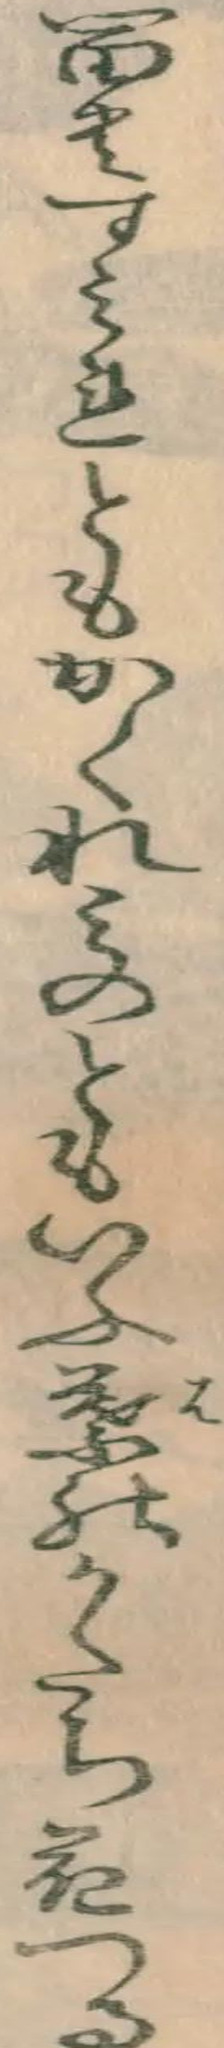富貴すみれともかくれみのともいふ葉のかたち花つる
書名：畫本野山草. [5]
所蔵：国立国会図書館 National Diet Library, JAPAN
